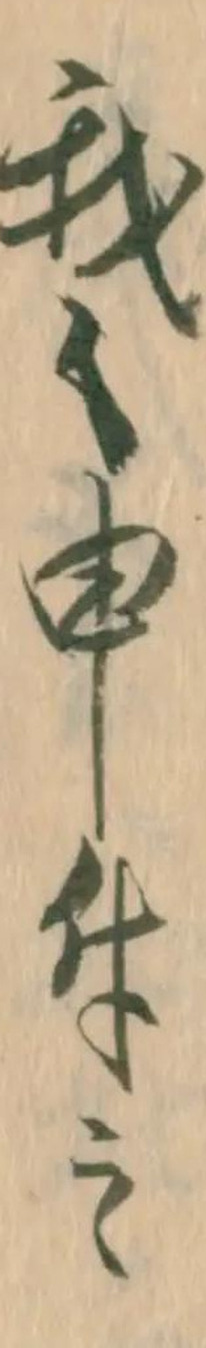我々申付之
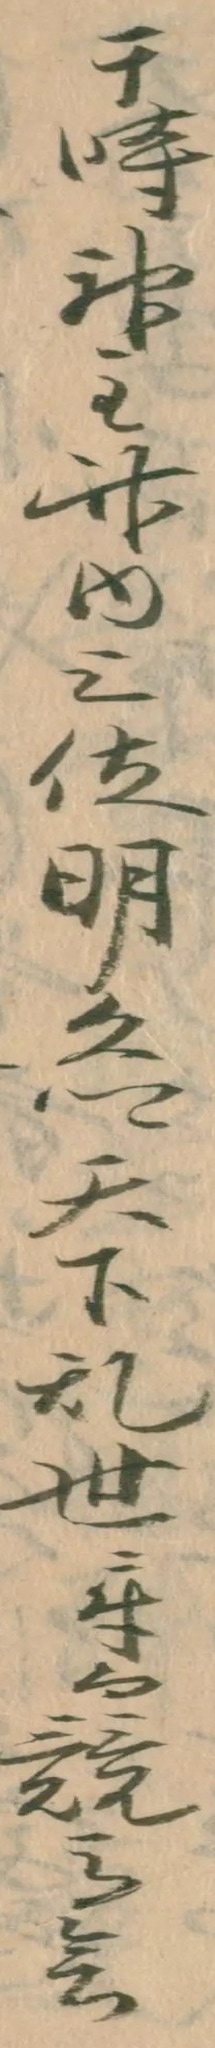于時神主竹内三位明久卿天下乱世ニ付而競馬会
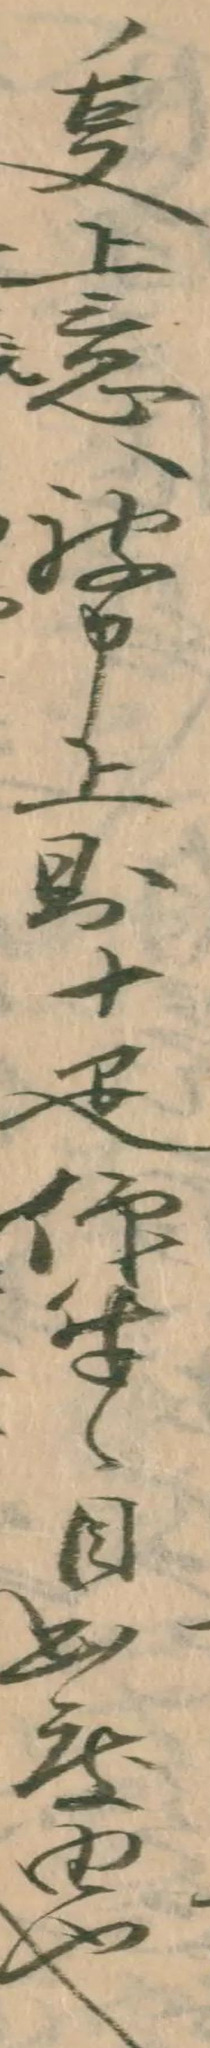ノ事上意へ被申上則十疋仰付候目出度由也
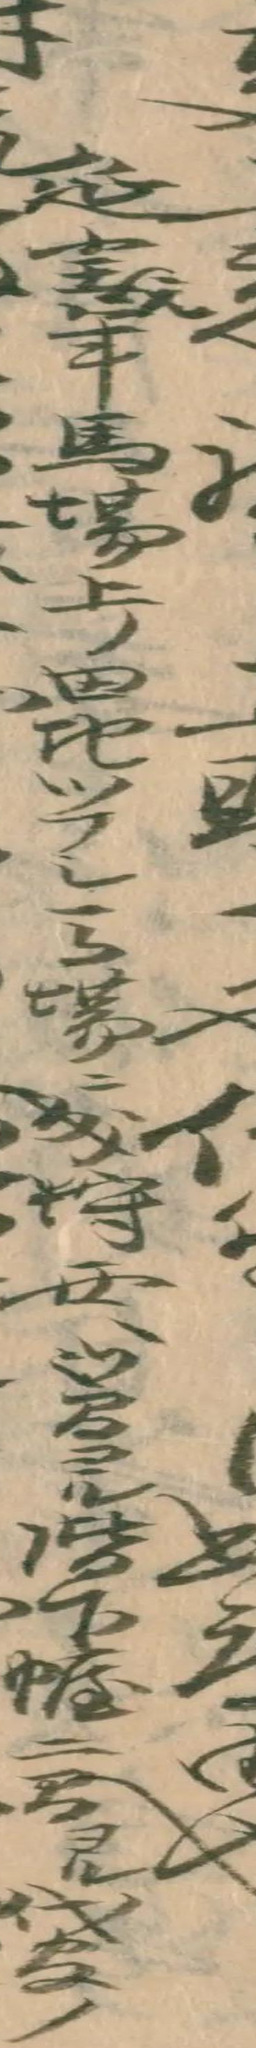延宝元年馬場上ノ田地ツフレ馬場ニ成埒西へ弐間ヨル階下幄二間ヨル代官ノ
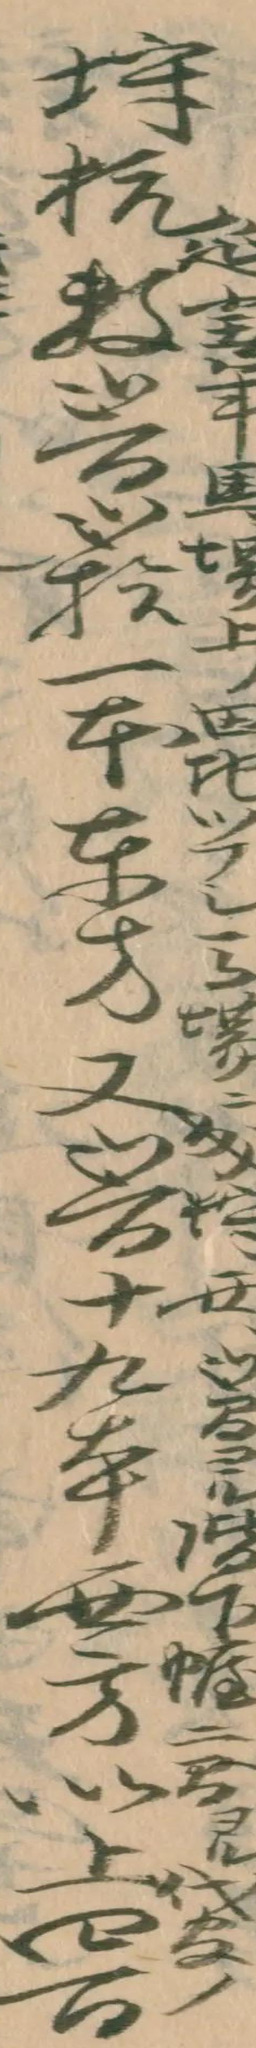一埒杭数弐百弐拾一本東方又弐百十九本西方以上四百
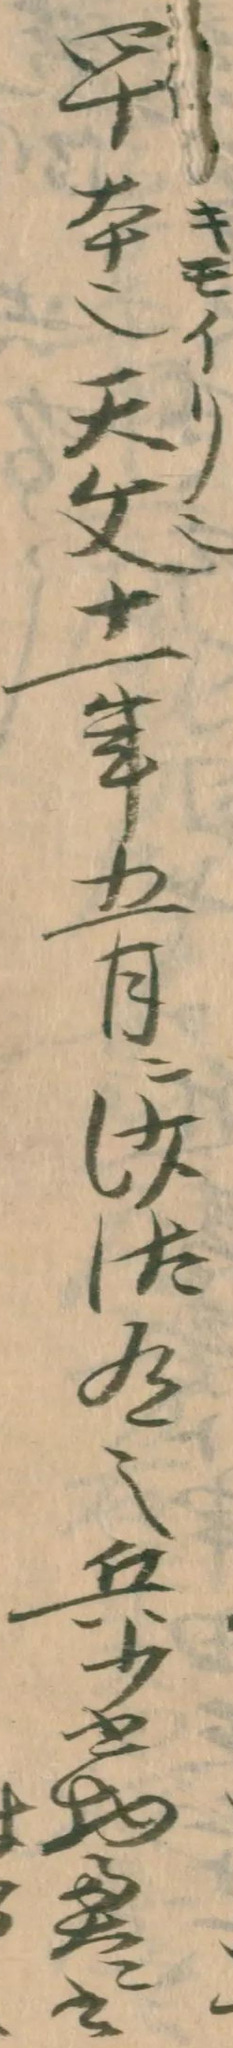四十本也天文十一年五月ニ沙汰有之兵少書物奥ニ書付有之
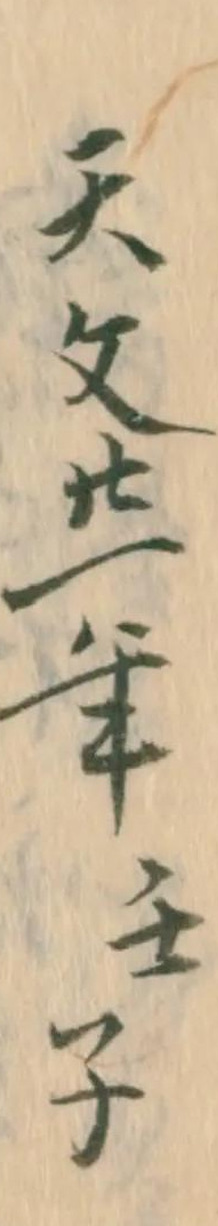天文廿一年壬子
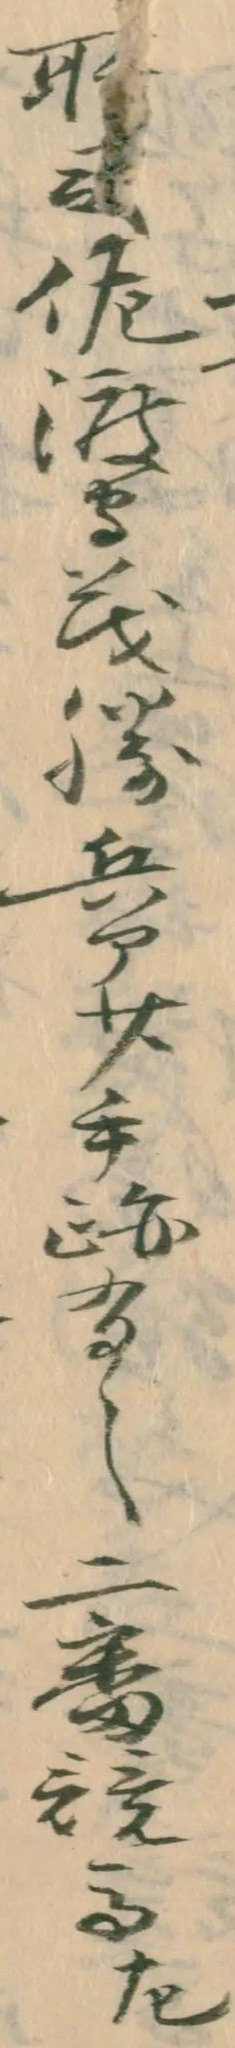所司佐渡守茂勝兵部少手跡有之二番競馬左
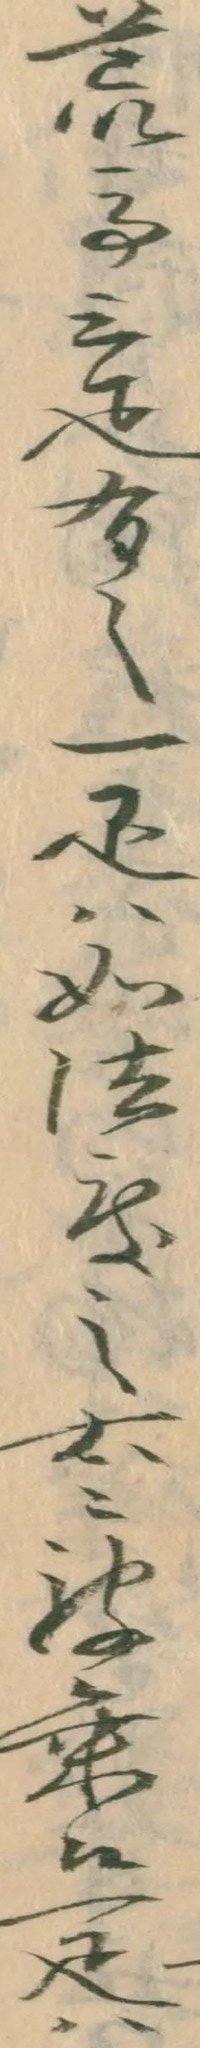荒馬三疋有之一疋ハ如法度之右ニ被乗候一疋ハ
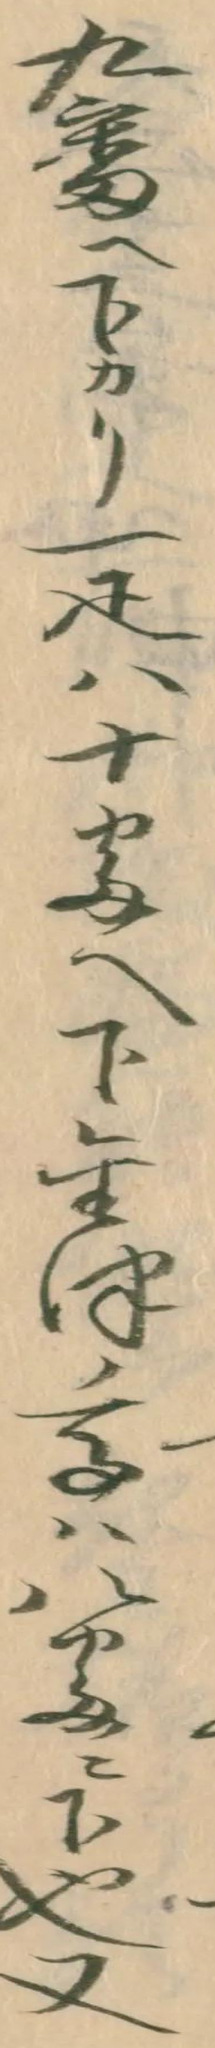九番ヘ下カリ一疋ハ十番へ下金津ノ馬ハ八番ニ下也又
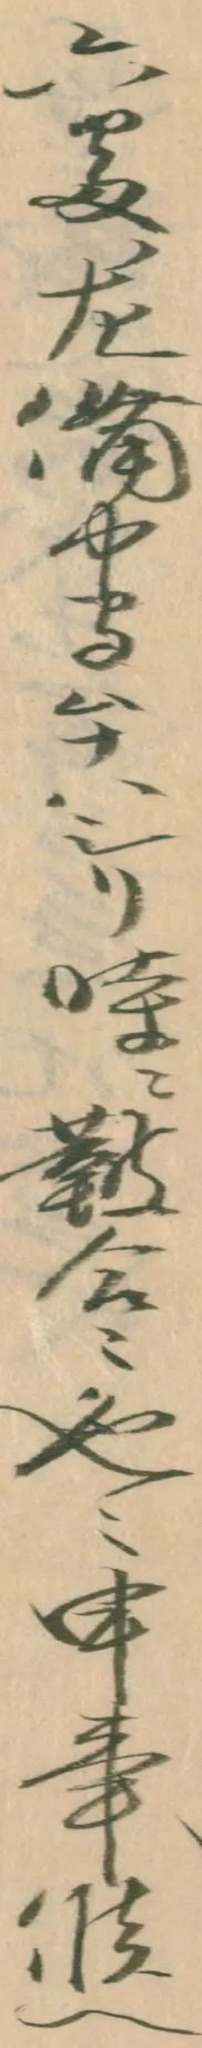六番ノ左備中守ムナハシリ時ニ鞁合ニ色々申事候へ
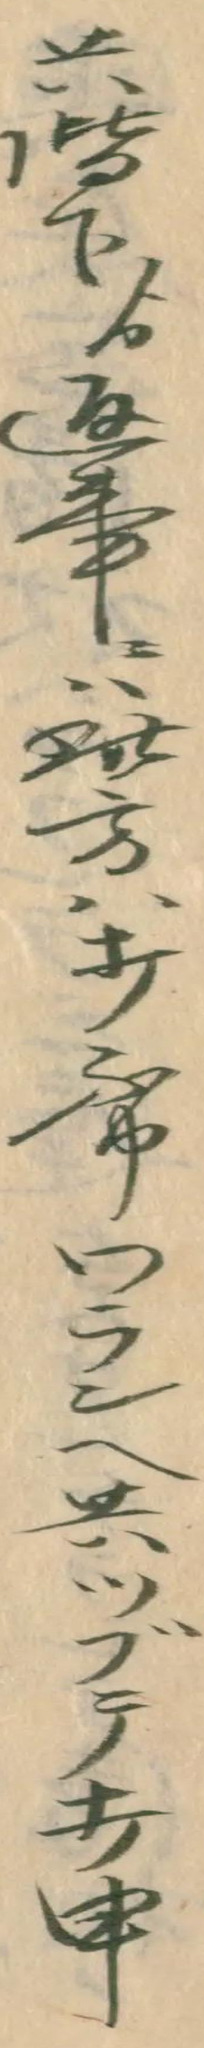共皆下ゟ返事ニハ此方ハ打不申ワランへ共ツブテ打申
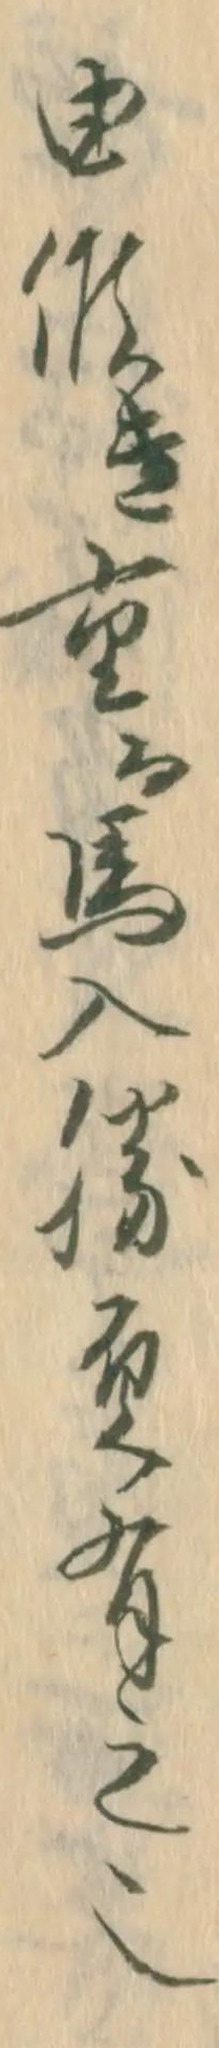由候き重而馬入勝負有之也
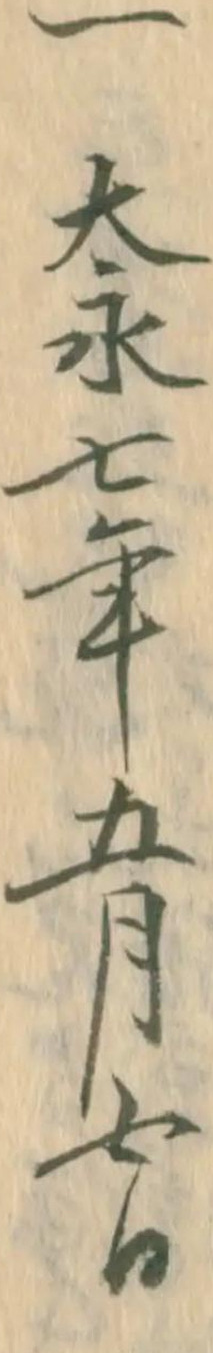一大永七年五月七日

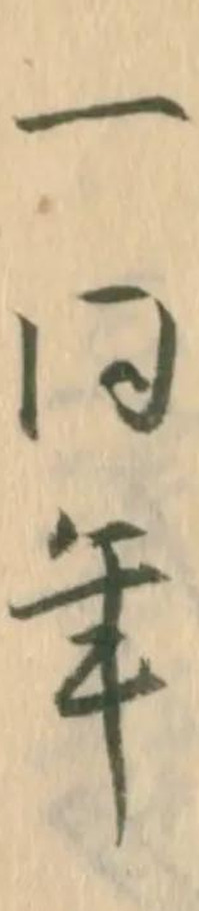一同年
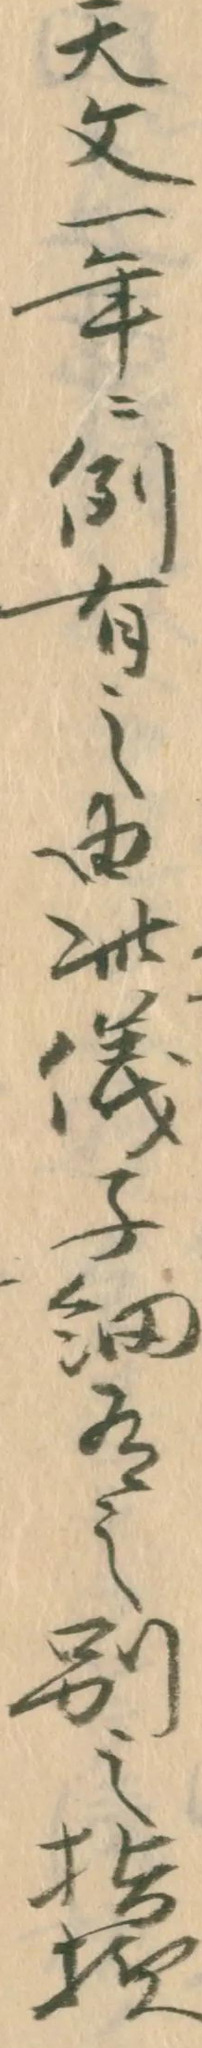天文一年ニ例有之由此儀子細有之別之指様
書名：賀茂社記録. 第12冊
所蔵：国立国会図書館 National Diet Library, JAPAN
